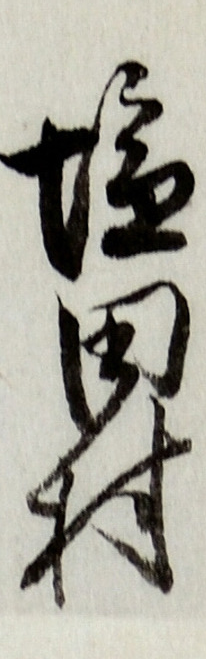塩田村
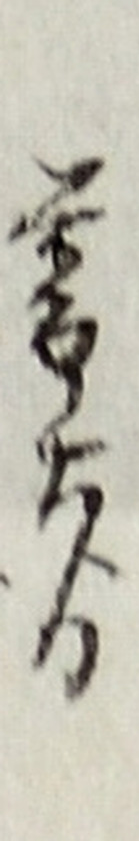善右衛門
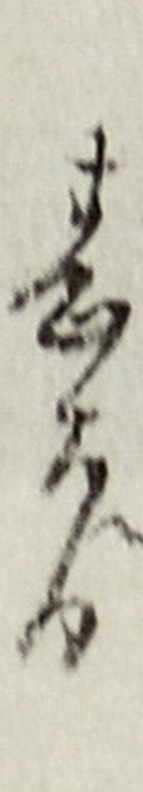甚右衛門
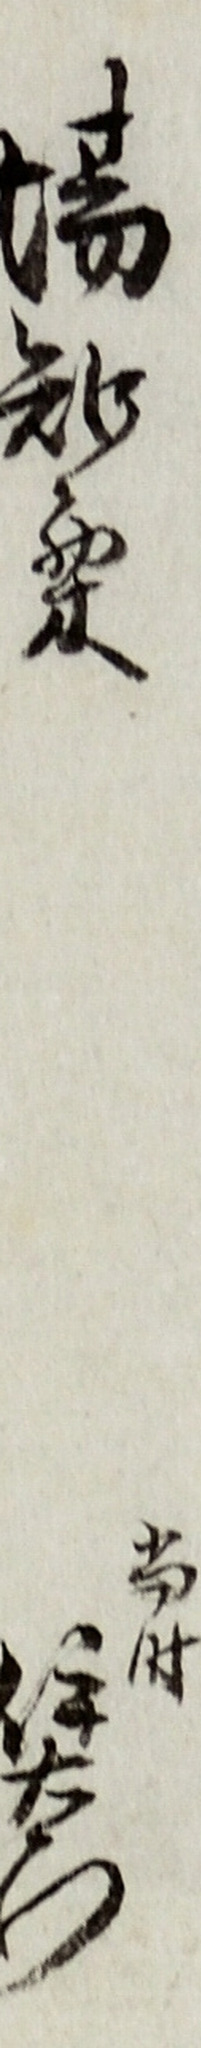場知栗伊右衛門
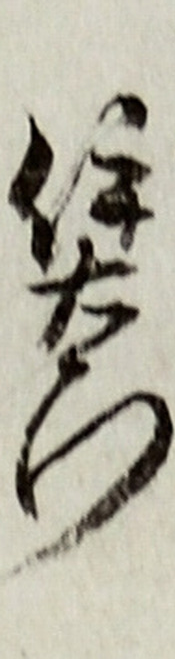善右衛門
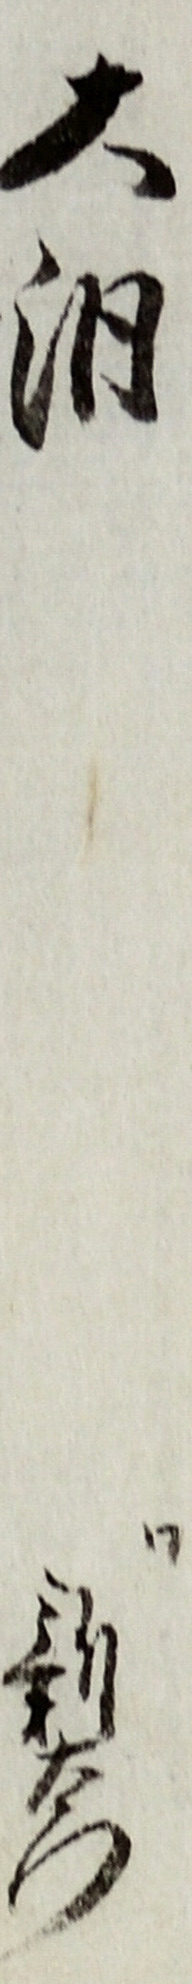大洞新右衛門
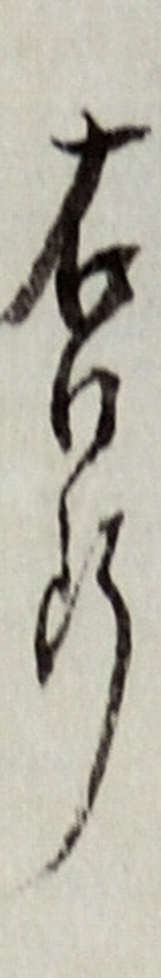右同断
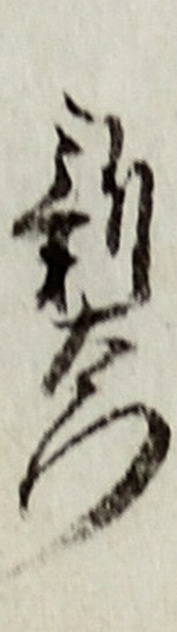善右衛門
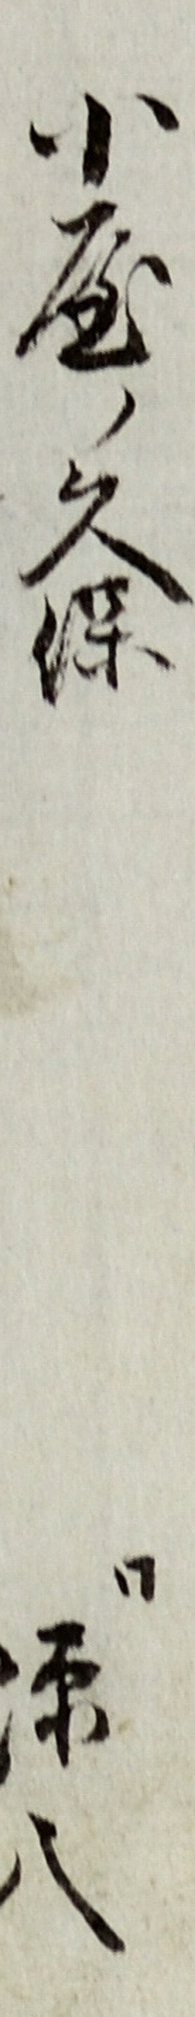小屋ノ久保源八
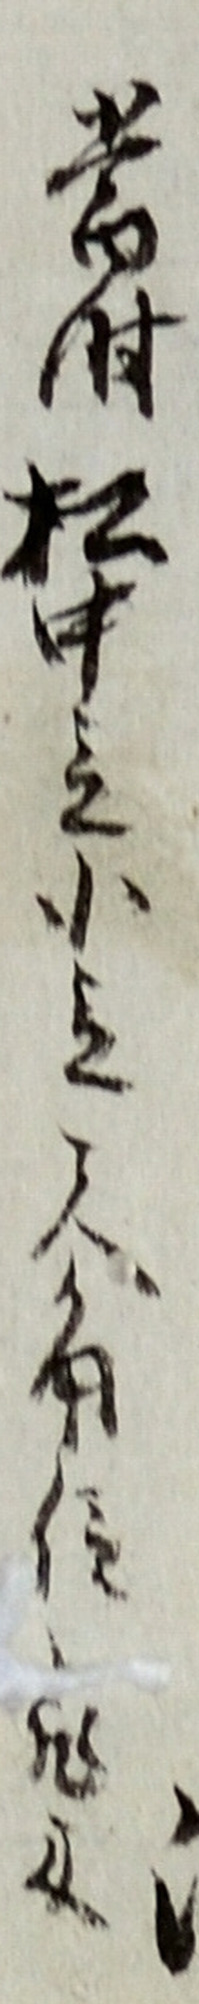当寺松中立小立尺角位飛木

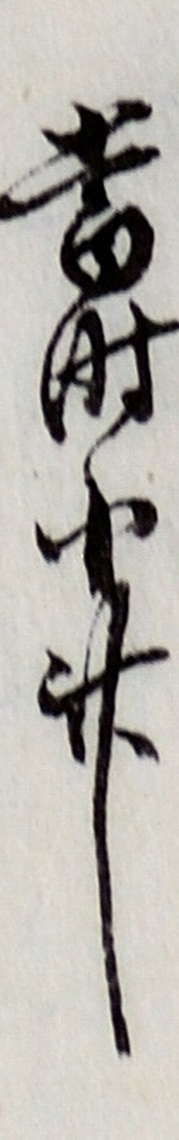当時小竹
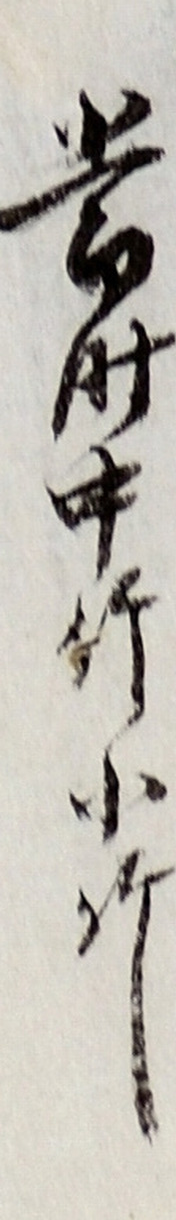当時中竹小竹
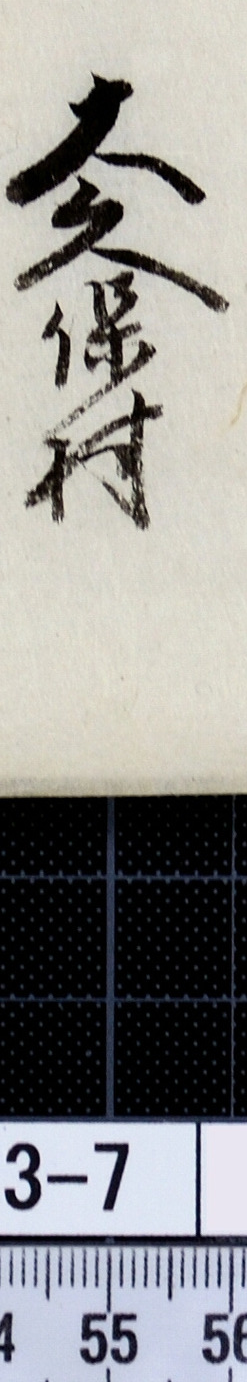大久保村
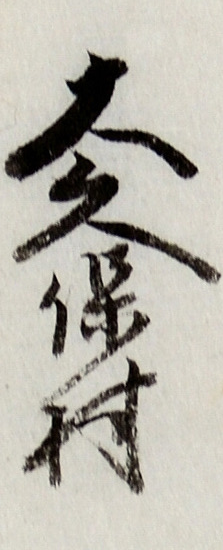大久保村
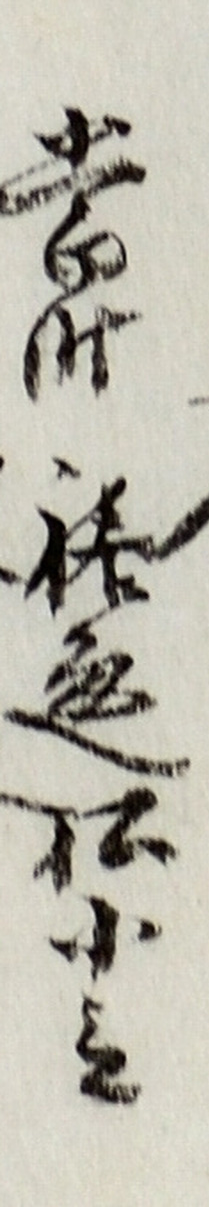当時裾辺松小立
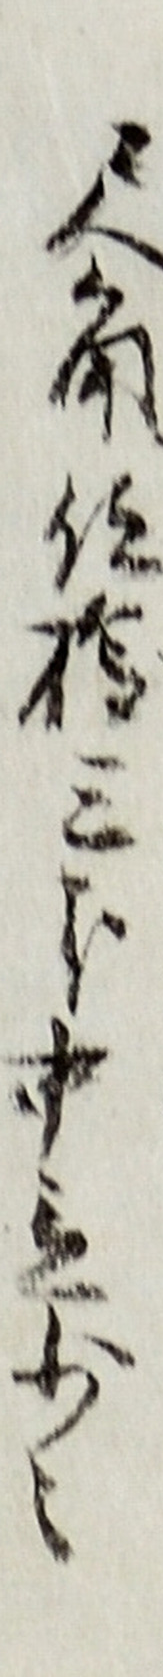尺角位拾三本中立少々
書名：郷中御林御竹薮名所附守之名前帳
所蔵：伊那市立高遠町図書館・合同会社AMANE
